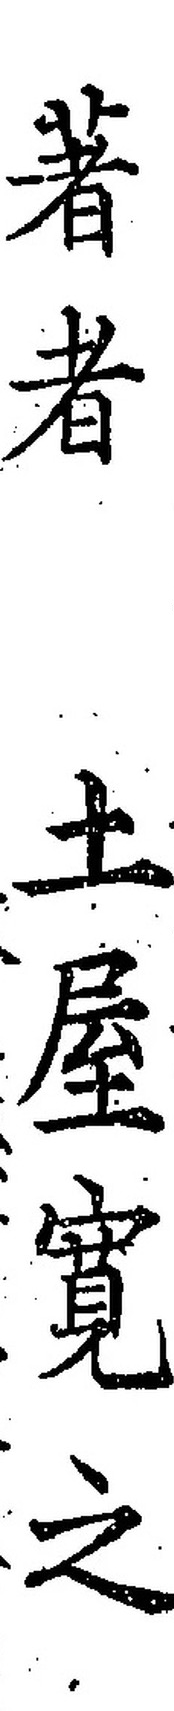著者土屋寛之
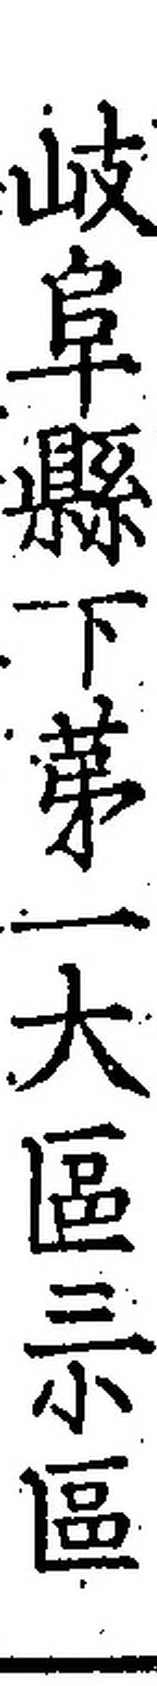岐阜県下第一大区三小区
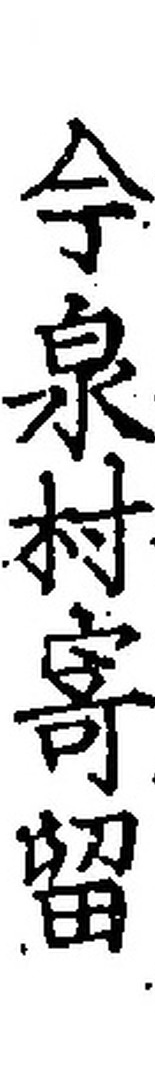今泉村寄留
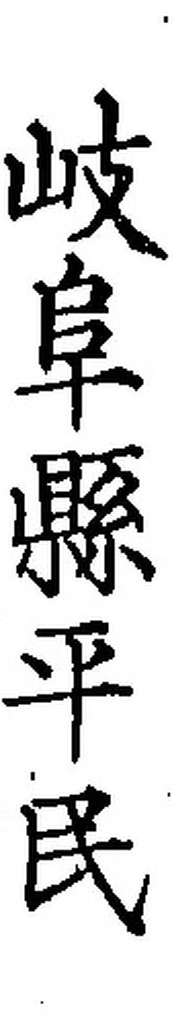岐阜県平民
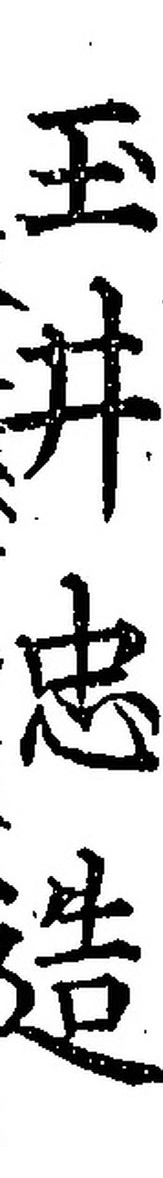玉井忠造
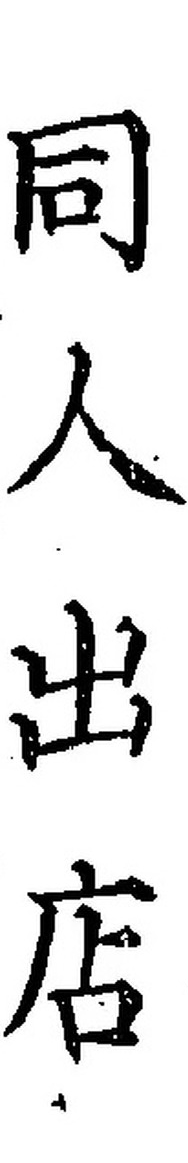同人出店
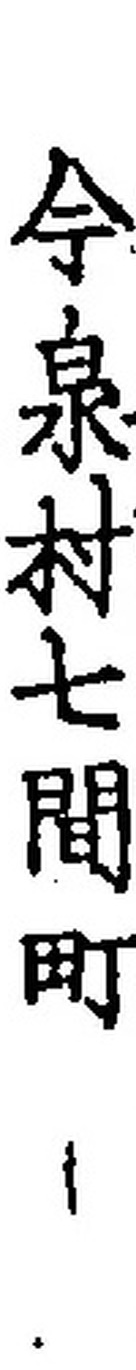今泉村七間町
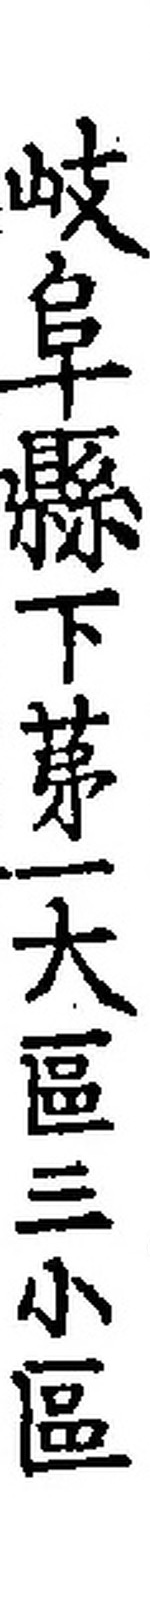岐阜県下第一大区三小区
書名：伝染病予防法
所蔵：国立国会図書館 National Diet Library, JAPAN
